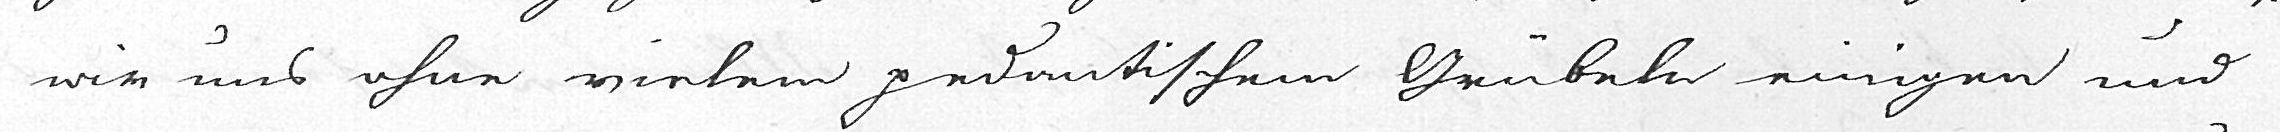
wir uns ohne vielem pedantischem Grübeln einigen und
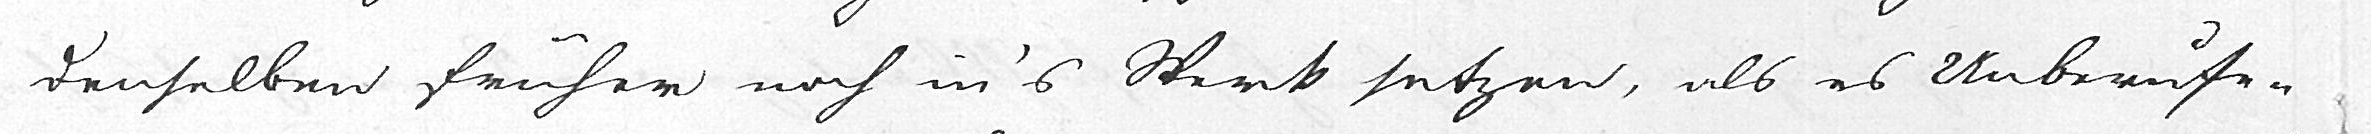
denselben früher noch in's Werk setzen, als es Unberufe-
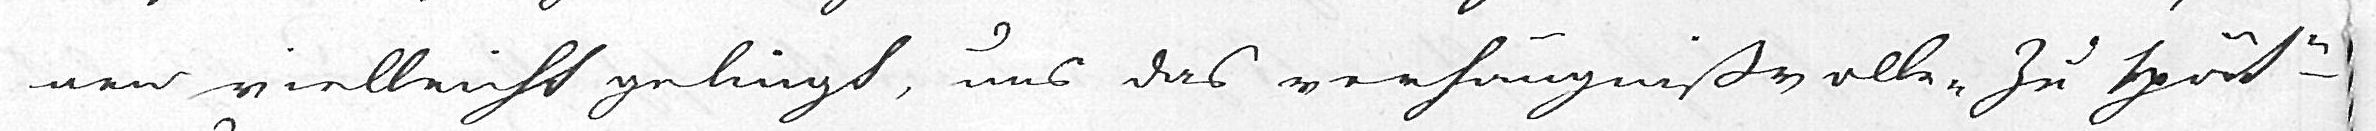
nen vielleicht gelingt, uns das verhängnißvolle "zu spät"
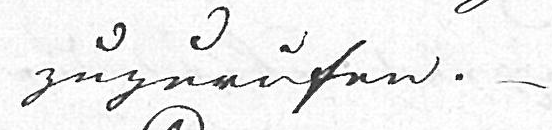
zuzurufen.
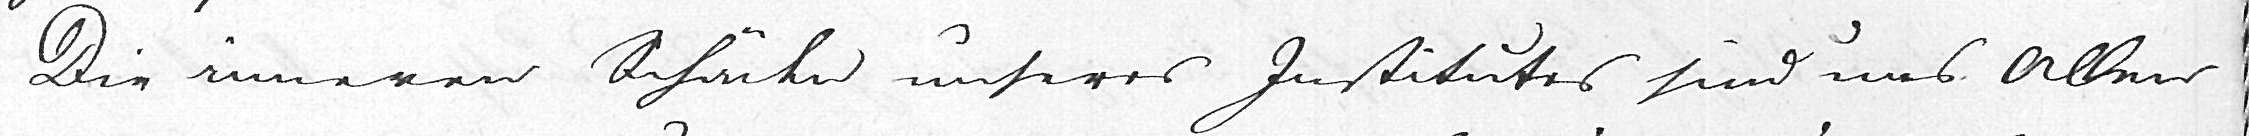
Die inneren Schächen unseren Institutes sind im Allen
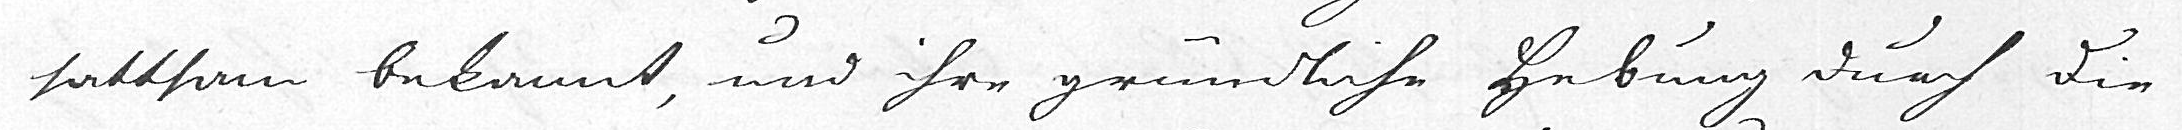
sattsam bekannt, und ihre gründlich Hebung durch die
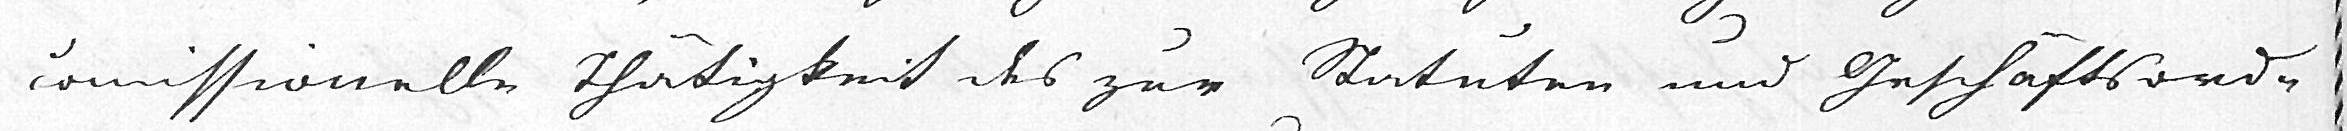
commissionelle Thätigkeit des zur Statuten und Geschäftsord-
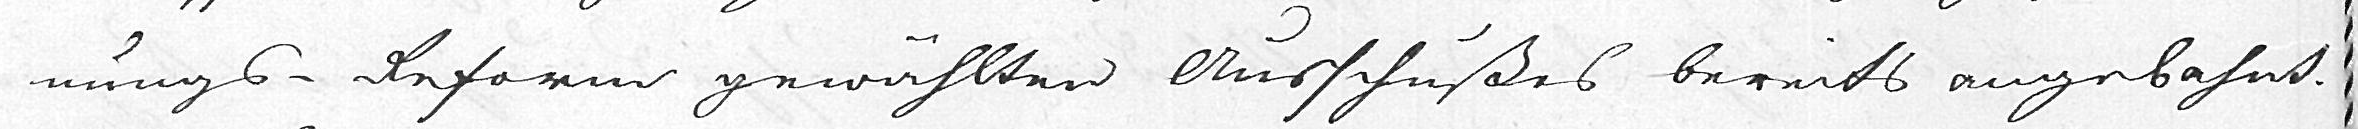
nungs-Reform gewählten Ausschußes bereits angebahnt.
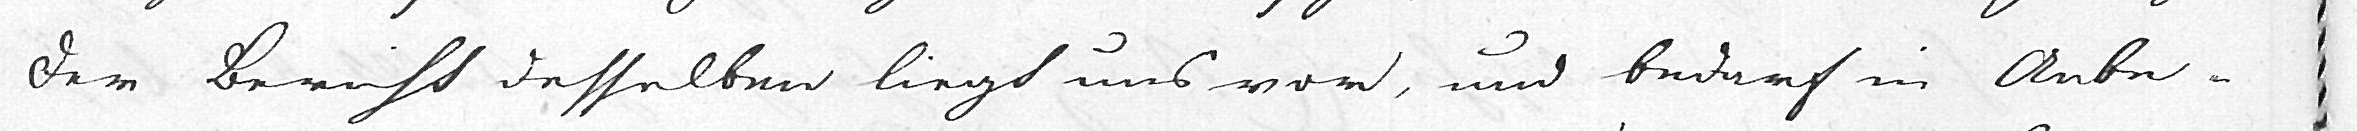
Der Bericht desselben liegt uns vor, und bedarf in Anbe-
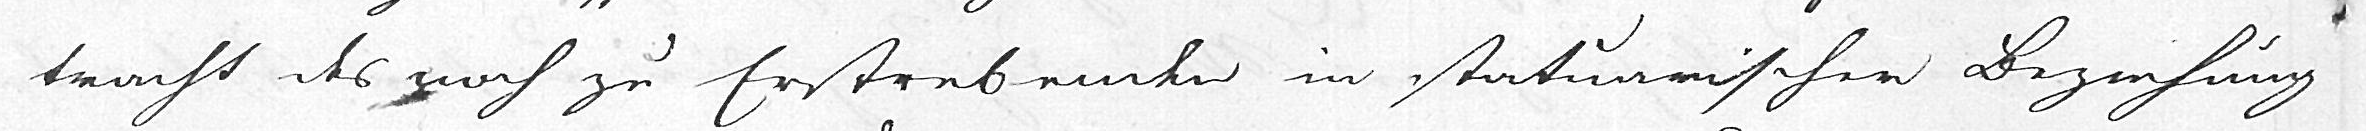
tracht des noch zu Erstrebenden in statuarischer Beziehung
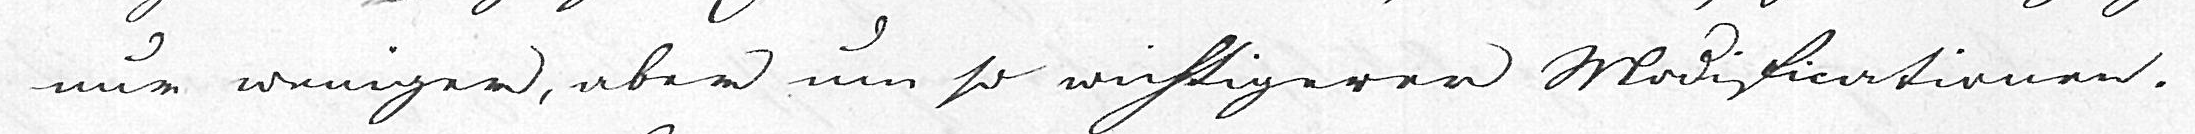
nur weniger, aber um so wichtigerer Modificationen.
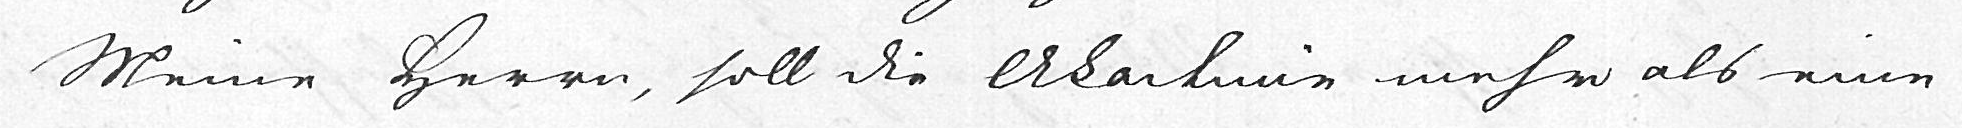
Meine Herrn, soll die Akademie mehr als eine
